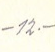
-12.-
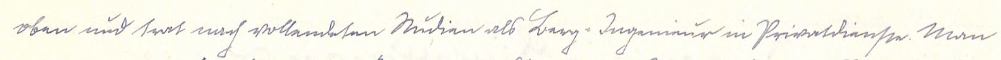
oben und trat nach vollenden Studien als Berg-Ingenieur in Privatdiensten. Man
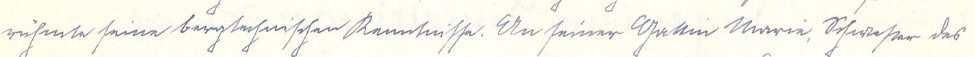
rühmte seine bergtechnischen Kenntnisse. An seiner Gattin Maria, Schwester des
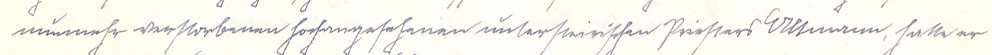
nunmehr verstorbenen hochangesehenen untersteirischen Priesters Altmann, hatte er
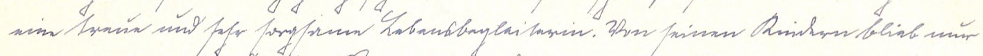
eine treue und sehr sorgsame Lebensbegleiterin. Von seinen Kindern blieb nur
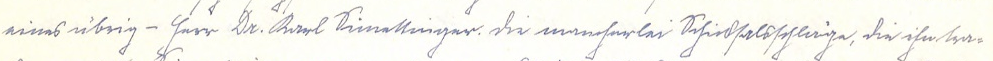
eines übrig - Herr Dr. Karl Simettinger. Die mancherlei Schicksalsschläge, die ihn tra-
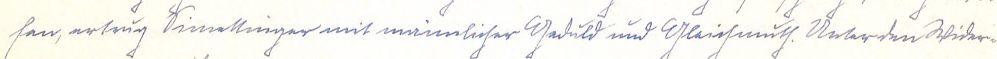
fen, ertrug Simettinger mit männlicher Geduld und Gleichmut. Unter den Wider-
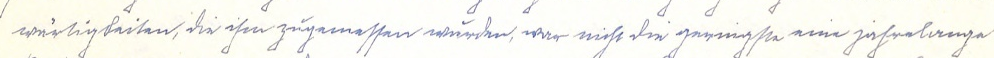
wärtigkeiten, die ihm zugemessen wurden, war nicht die geringste eine jahrelange
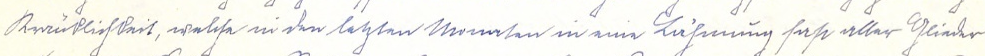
Kräncklichkeit, welche in den letzten Monaten in eine Lähmung fast aller Glieder
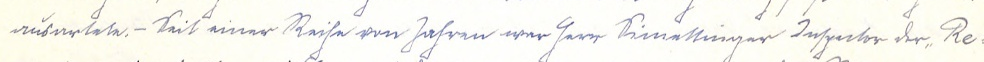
ausartete. - Seit einer Reihe von Jahren war Herr Simettinger Inspector der "Re-
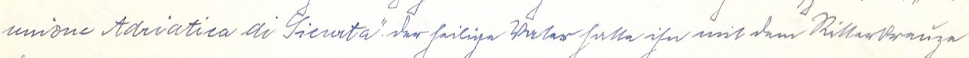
unione Adriatica di Sicurtà". Der heilige Vater hatte ihn mit dem Ritterkreuze
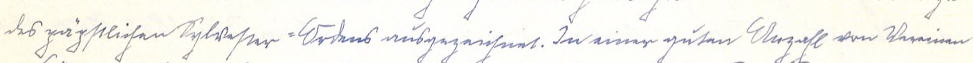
des päpstlichen XXX-Werkes ausgezeichnet. In einer guten Anzahl von Vereinen
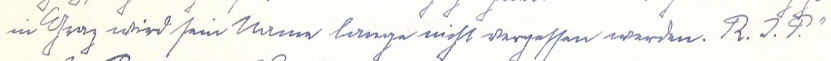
in Graz wird sein Name lange nicht vergessen werden. R. I. P."
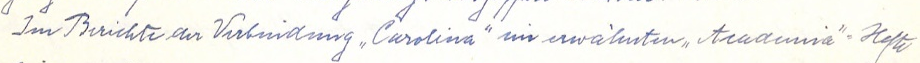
Im Berichte der Verbindung "Carolina" im erwähnten "Academia"-Hefte
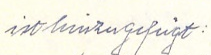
ist hinzugefügt:
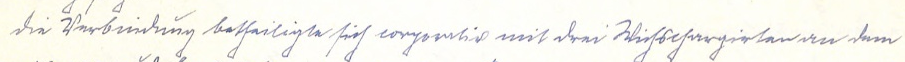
Die Verbindung betheiligte sich corporatis mit drei Wichschargierten an dem
